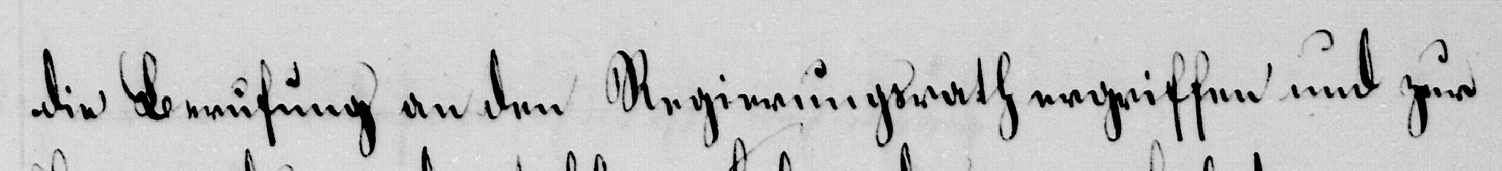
die Berufung an den Regierungsrath ergriffen und zur
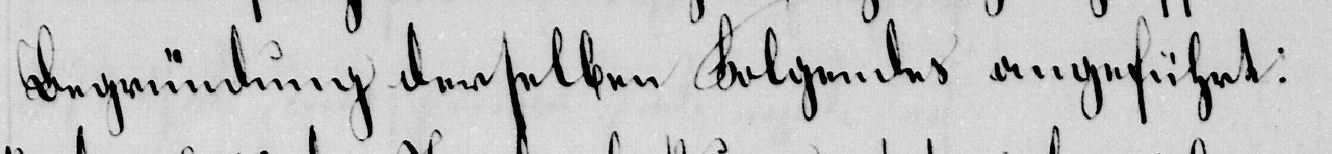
Begründung derselben Folgendes angeführt:
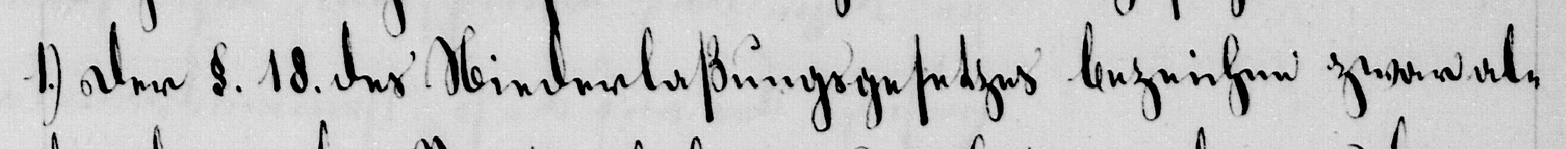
1.) Der §. 18. des Niederlaßungsgesetzes bezeichne zwar al¬
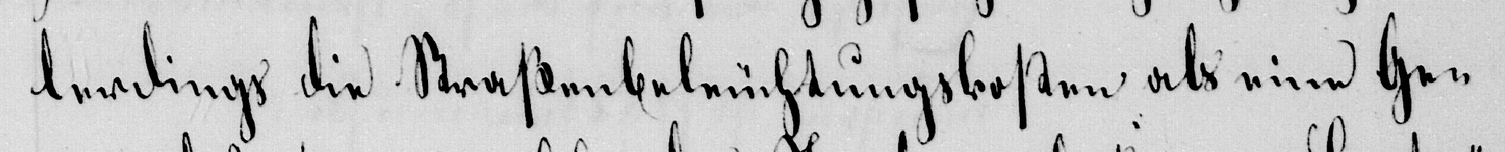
lerdings die Straßenbeleuchtungskosten als eine Ge¬
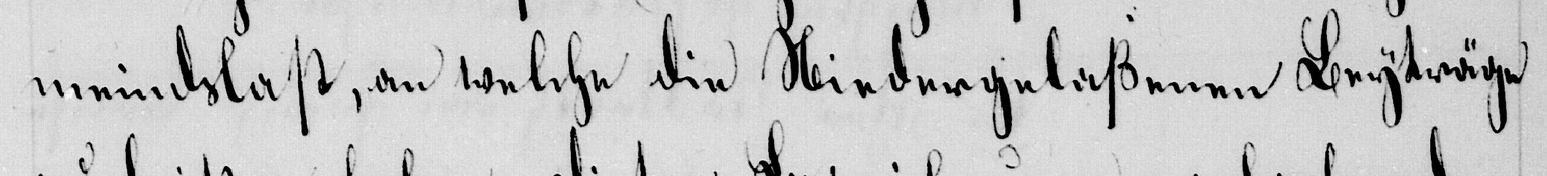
meindslast, an welche die Niedergelaßenen Beyträge
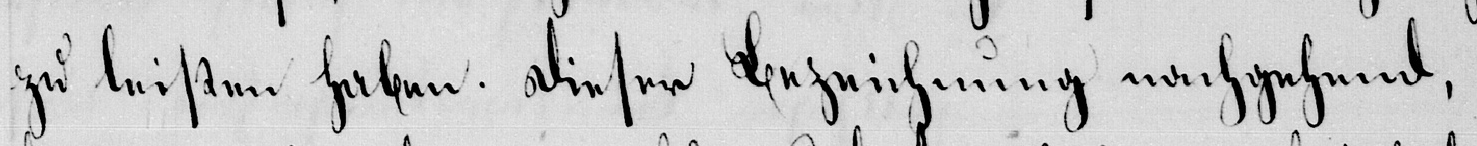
zu leisten haben. Dieser Bezeichnung nachgehend,
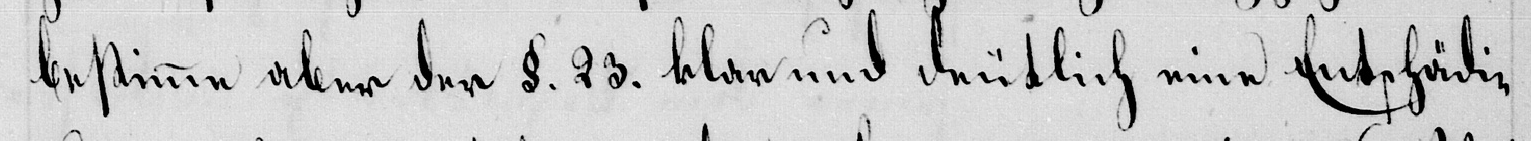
bestimme aber der §. 23. klar und deutlich eine Entschädi¬
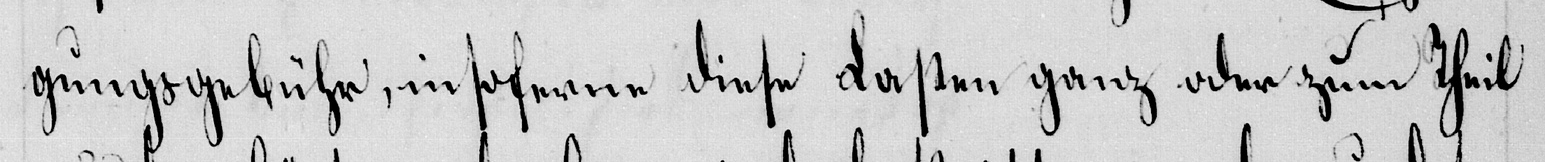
gungsgebühr, insoferne diese Lasten ganz oder zum Theil
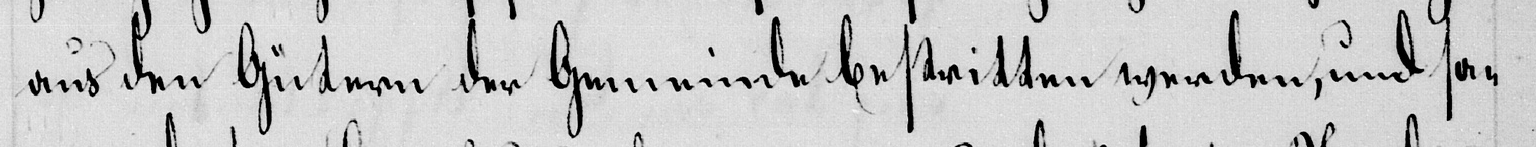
aus den Gütern der Gemeinde bestritten werden, und sa¬
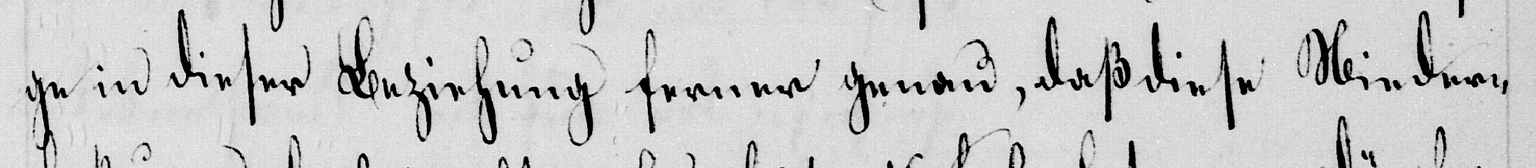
ge in dieser Beziehung ferner genau, daß diese Nieder¬
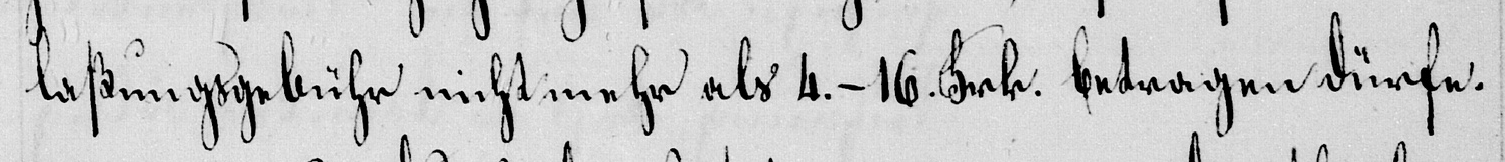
laßungsgebühr nicht mehr als 4.–16. Frk. betragen dürfe.
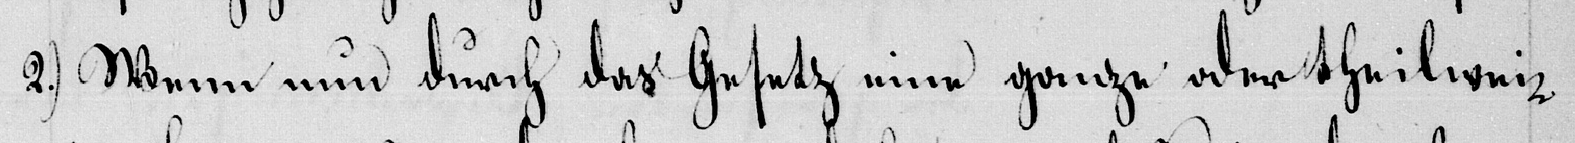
2.) Wenn nun durch das Gesetz eine ganze oder theilwei¬
